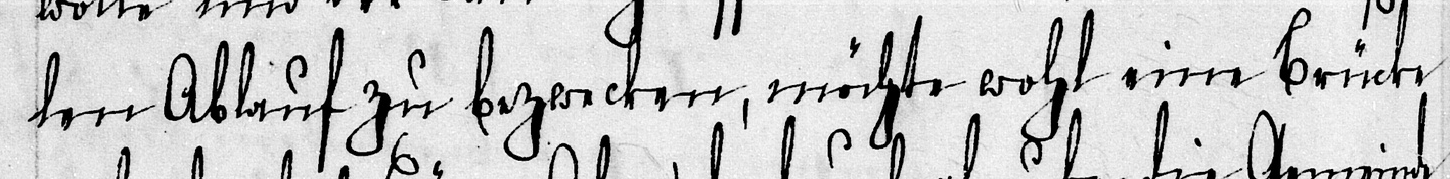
len Ablauf zu bezwecken, möchte wohl eine Brücke
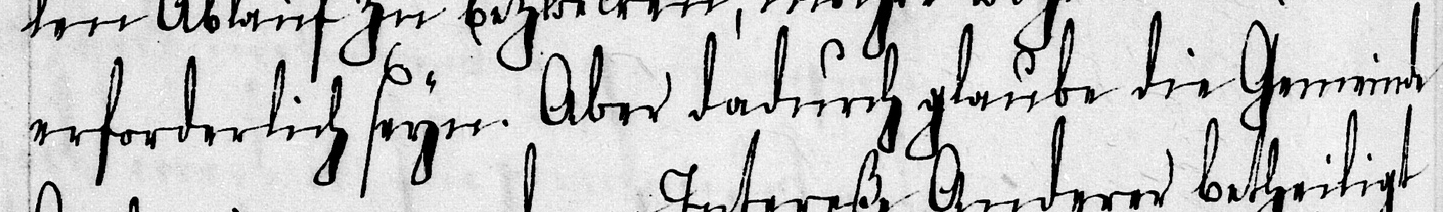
erforderlich seyn. Aber dadurch glaube die Gemeinde
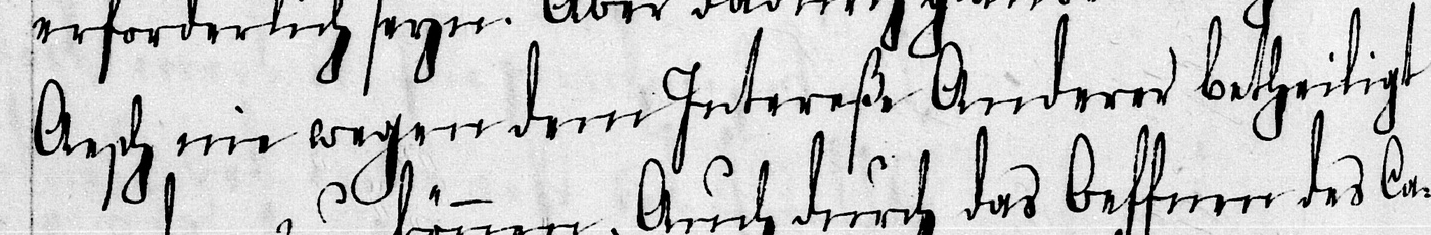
Aesch nie wegen dem Intereße Anderer betheiligt
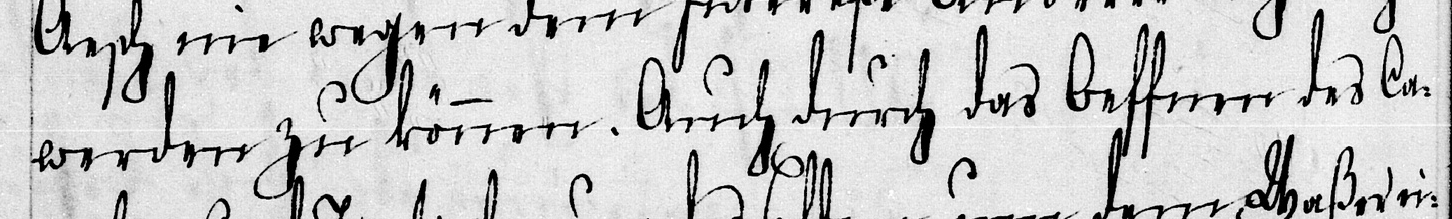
werden zu können. Auch durch das Oeffnen des Ca¬
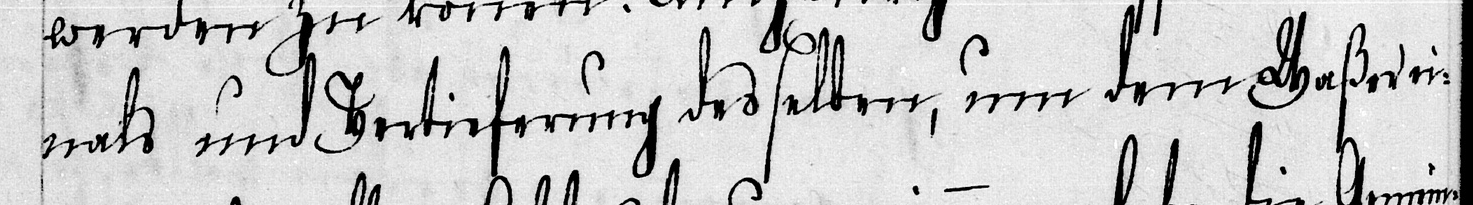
nals und Vertieferung desselben, um dem Waßer ei¬
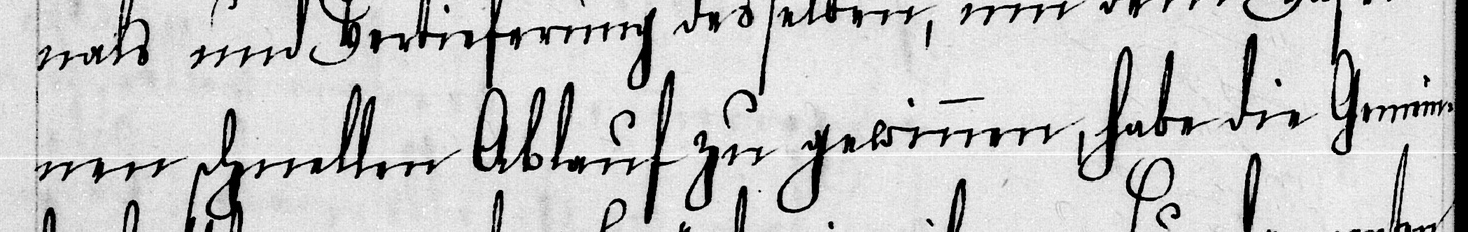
nen schnellen Ablauf zu gewinnen, habe die Gemei¬
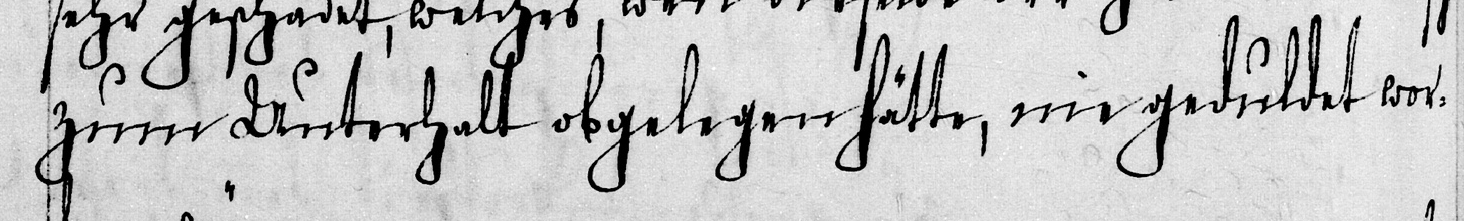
zum Unterhalt obgelegen hätte, nie geduldet wo¬
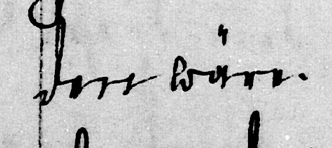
rden wäre.
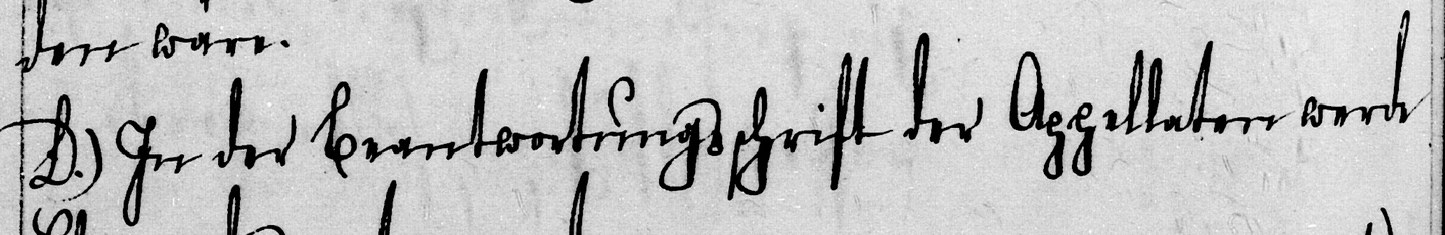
D.) In der Beantwortungsschrift der Appellaten werde
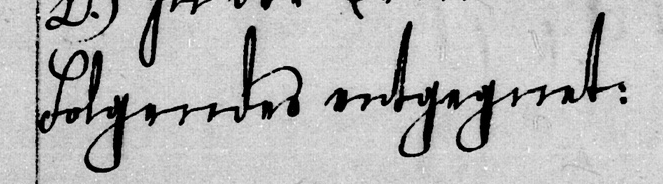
Folgendes entgegnet:
